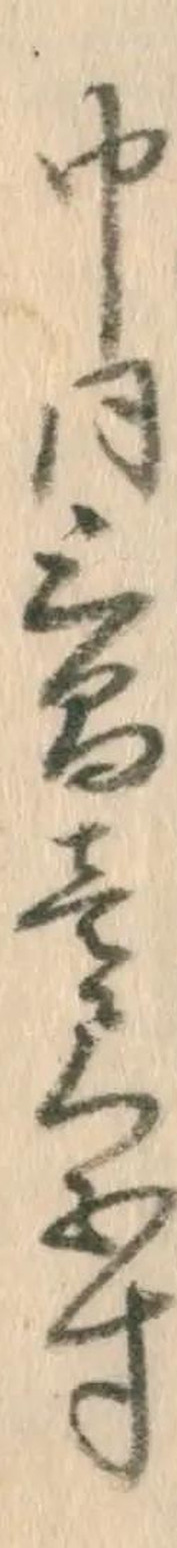巾同三間壱尺五寸
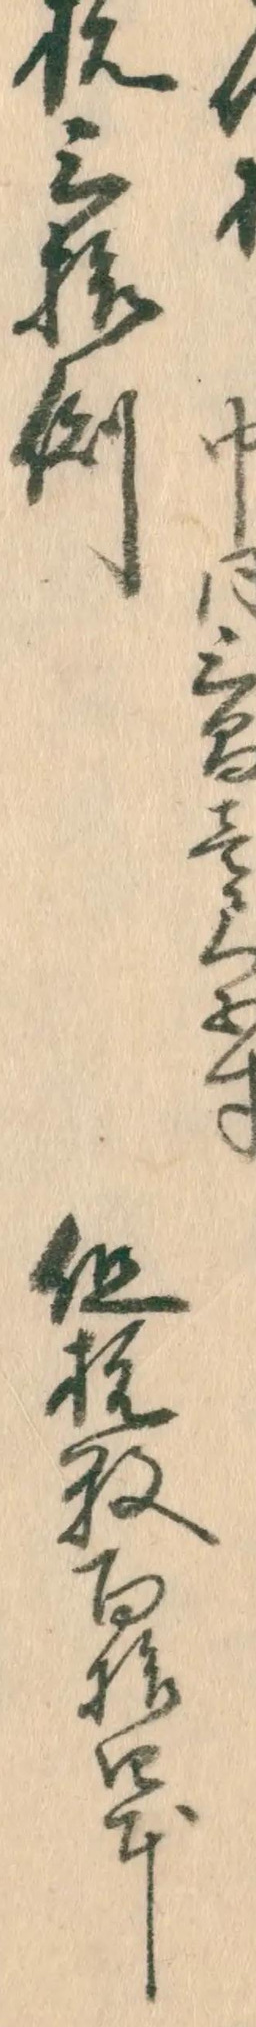杭三拾側但杭数百拾四本
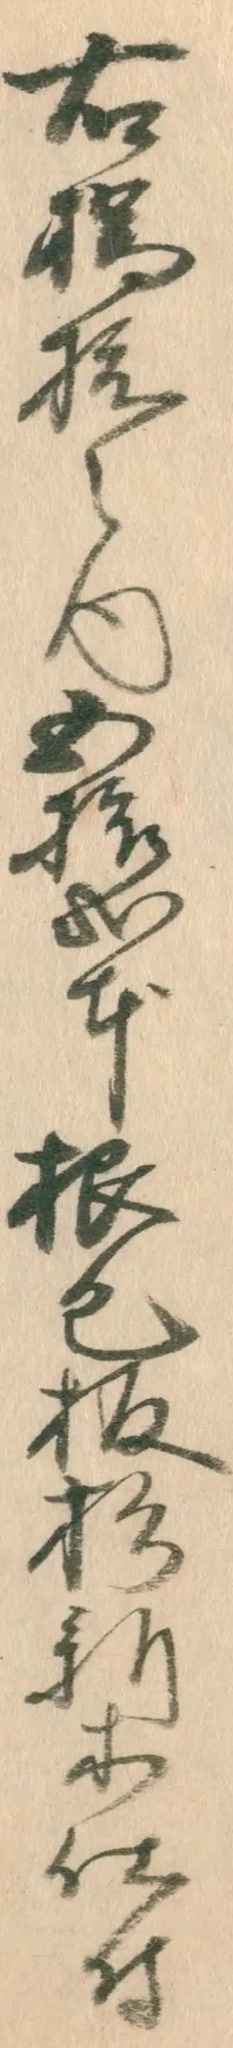右橋杭之内五拾弐本根包板杉新木仕付

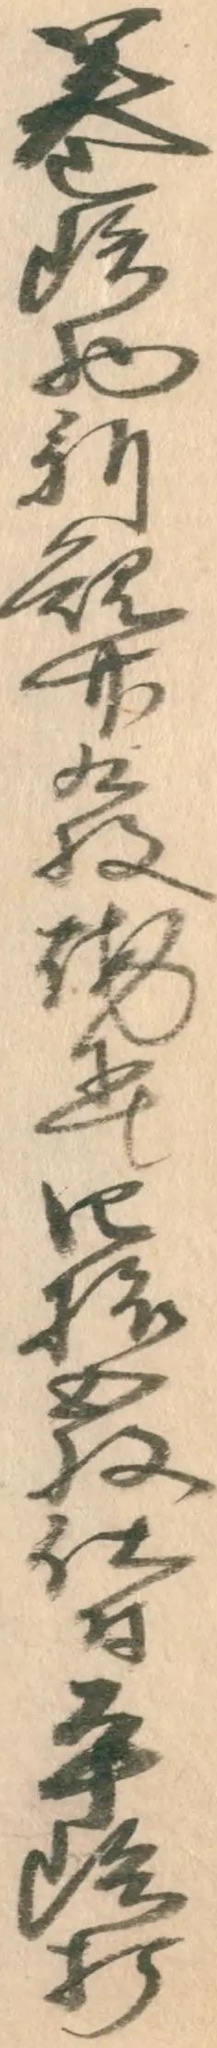巻鉄物新規廿九枚焼直し四拾五枚仕付平鋲打
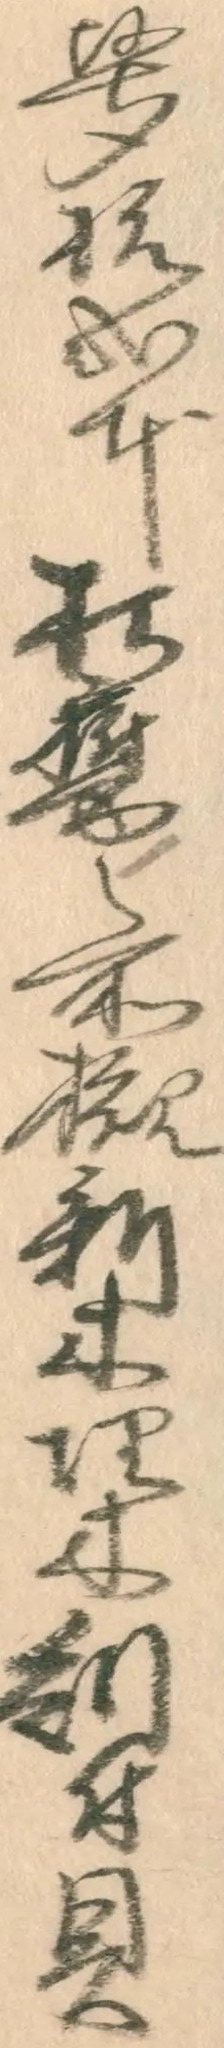堅メ杭弐本朽腐之所槻新木埋木矧付貝
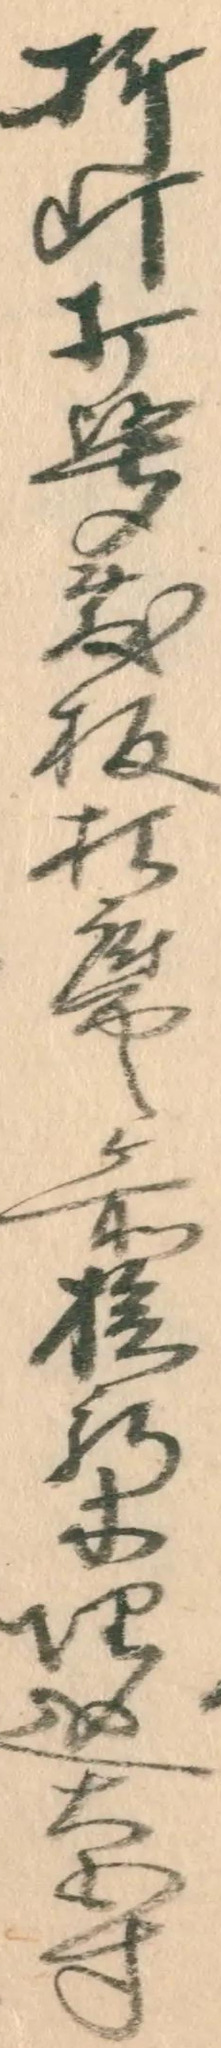折釘打堅メ敷板朽腐之ケ所桧新木埋込大五寸
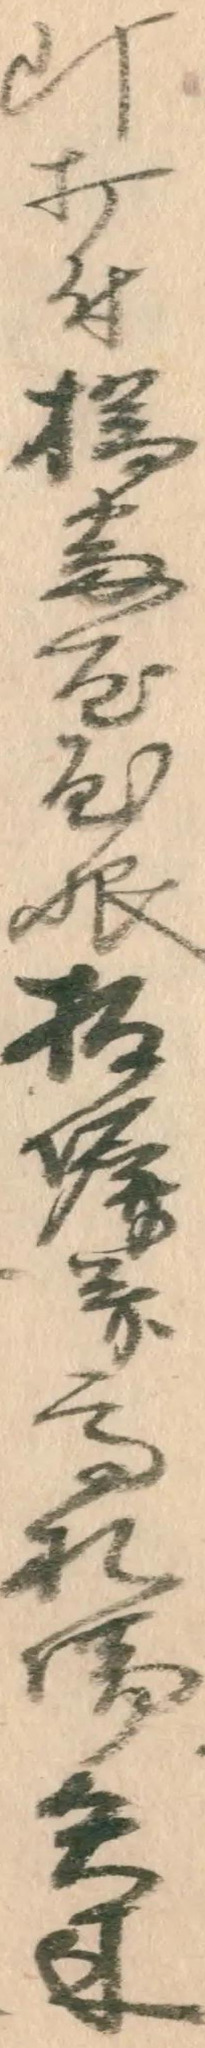釘打付橋番屋屋根板塀并高札場ノ矢来
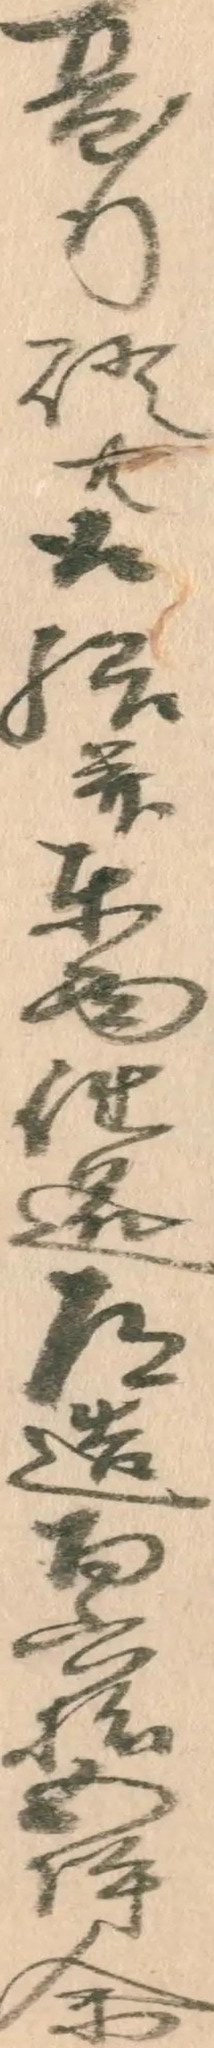台行灯共取繕并東西往還道造百六拾五坪余
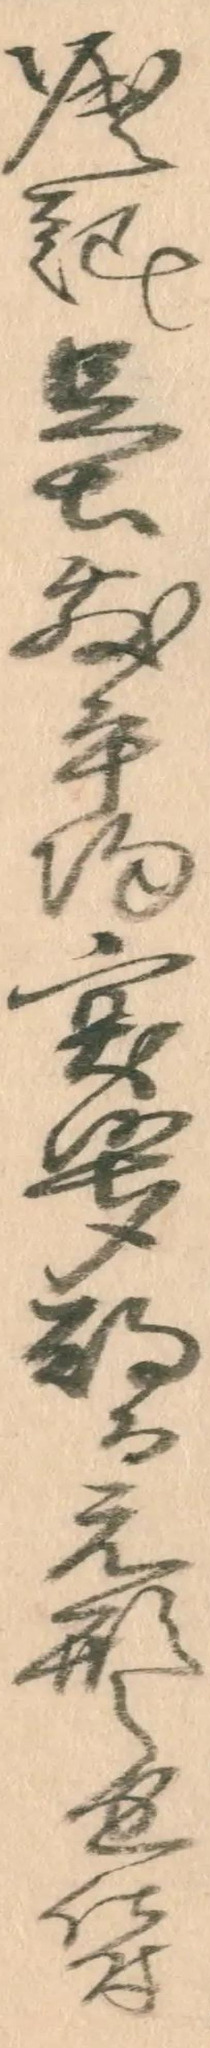掘起し足土敷平均突堅メ都而元形之通仕付
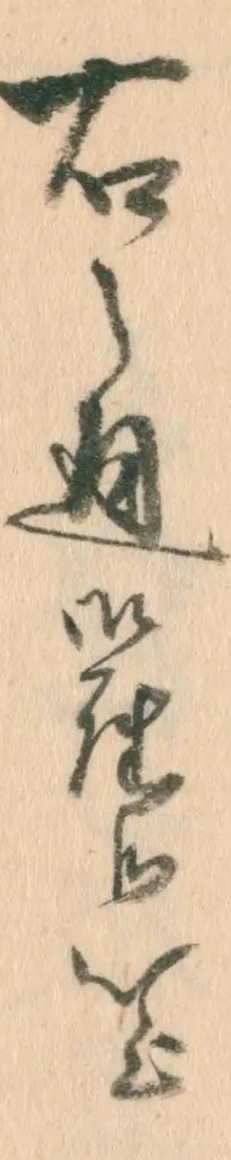右之通御座候以上
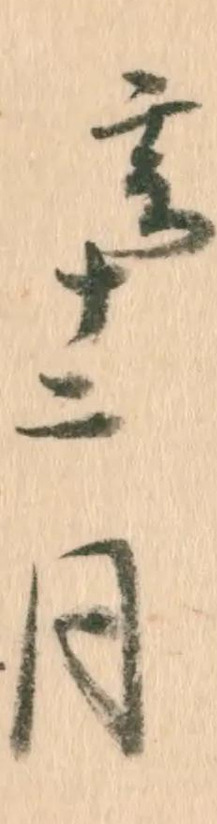亥十二月
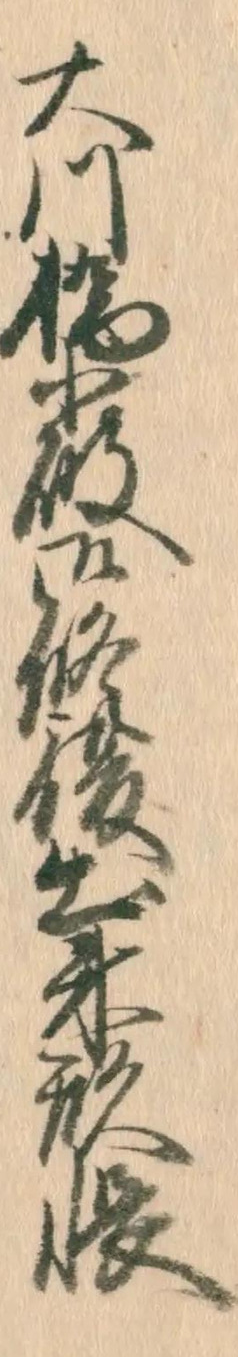大川橋小破御修復出来形帳
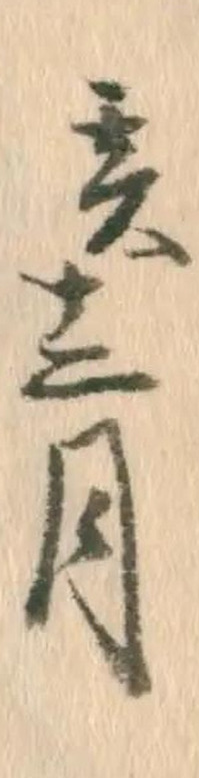亥十二月
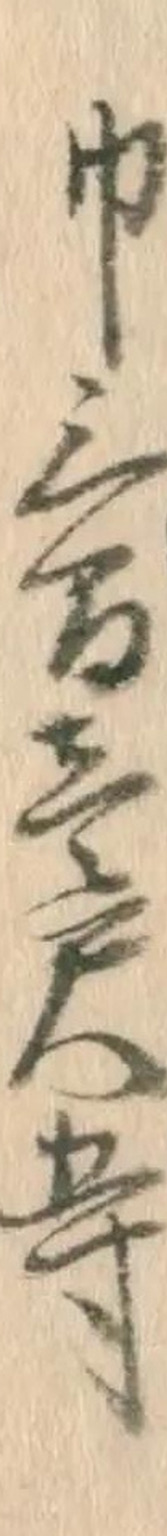巾三間壱尺五寸
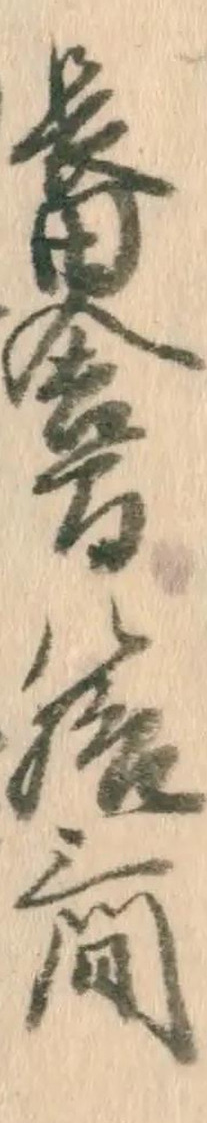一大川橋長田舎間八拾三間
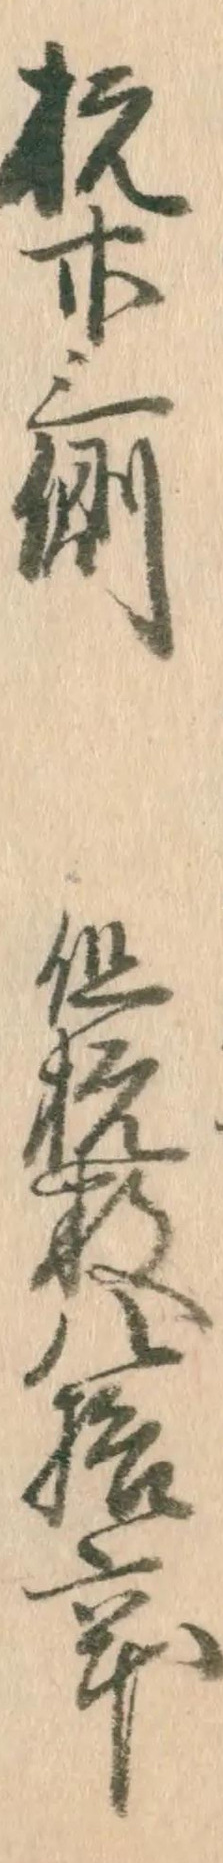杭廿三側但杭数八拾六本
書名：三橋 17巻. [7] 三橋小破御修復書留　但御奉行御掛リ替地震潰橋番屋　嘉永四亥年より安政二卯年迄　上
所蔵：国立国会図書館 National Diet Library, JAPAN
